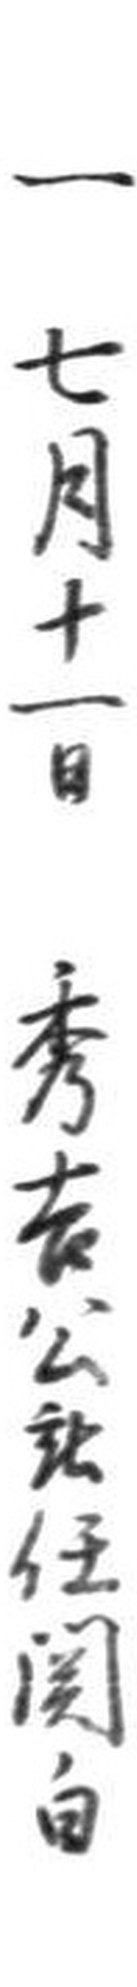一七月十一日秀吉公被任関白
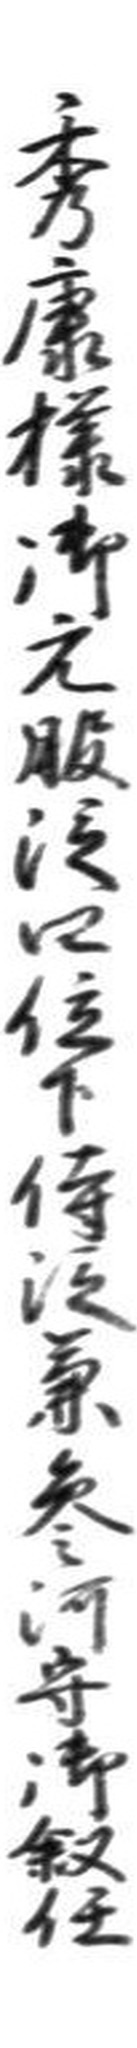秀康様御元服従四位下侍従兼参河守御叙任
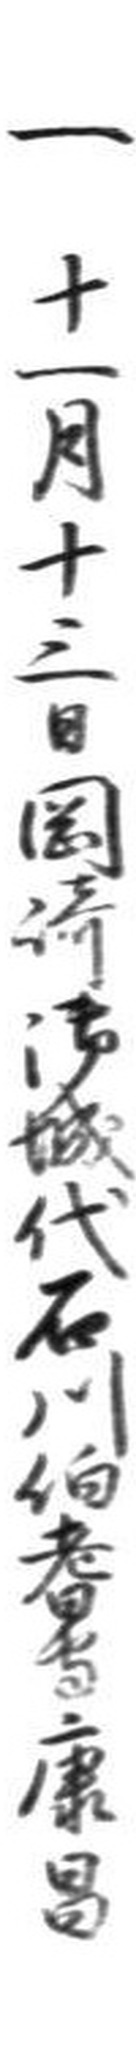一十一月十三日岡崎御城代石川伯耆守康昌
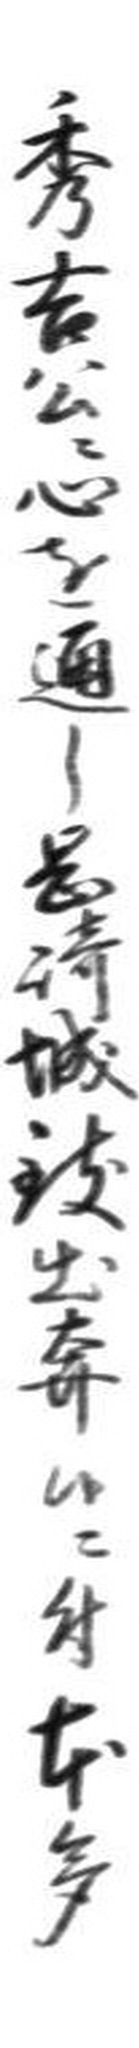秀吉公ニ心を通し岡崎城致出奔候ニ付本多
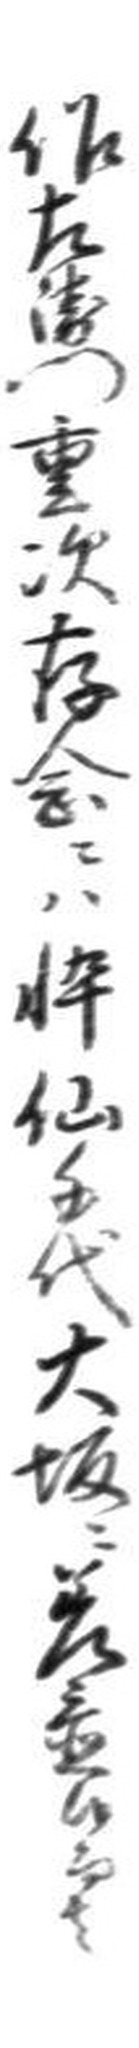作左衛門重次存念ニハ忰仙千代大坂ニ差置候而者
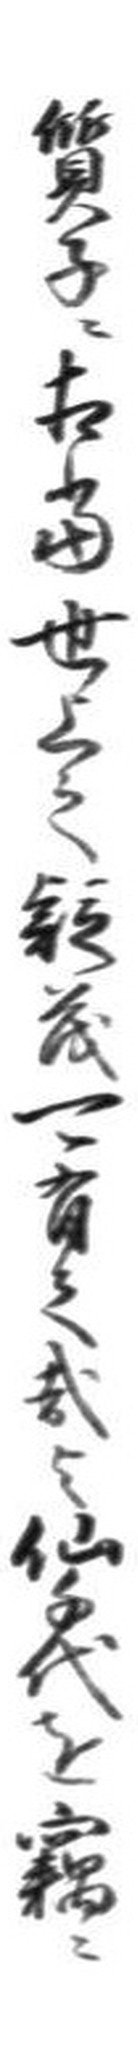質子ニ相当世上之疑茂可有之哉与仙千代を竊ニ
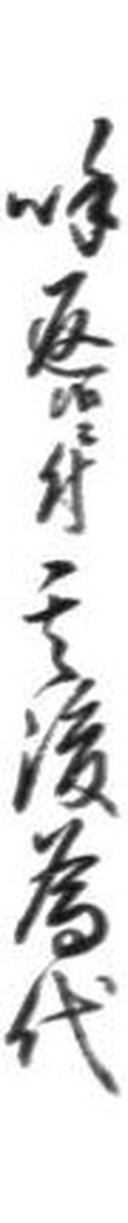呼返候ニ付其後為代

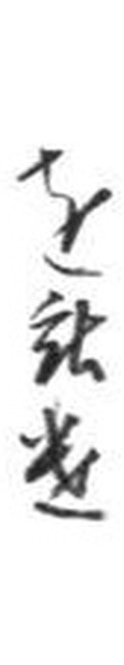を被遣
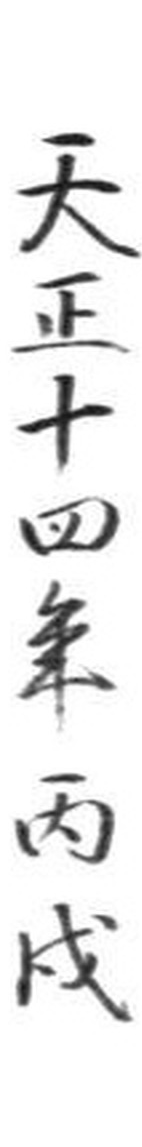天正十四年丙戌
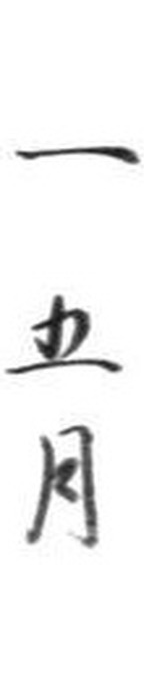一五月
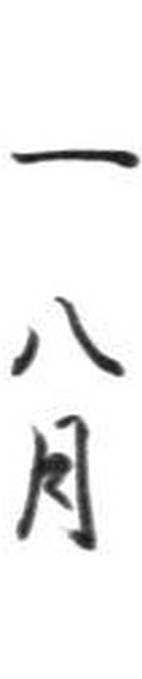一八月
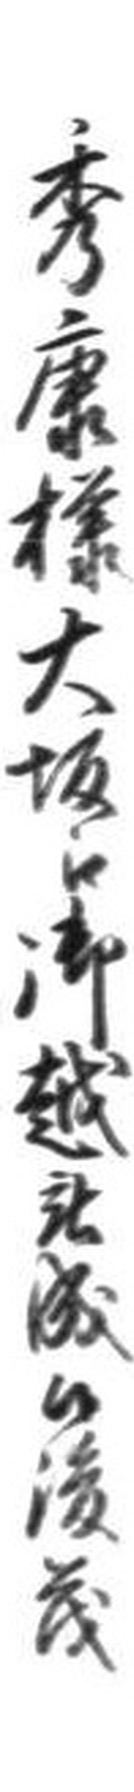秀康様大坂江御越被成候後茂
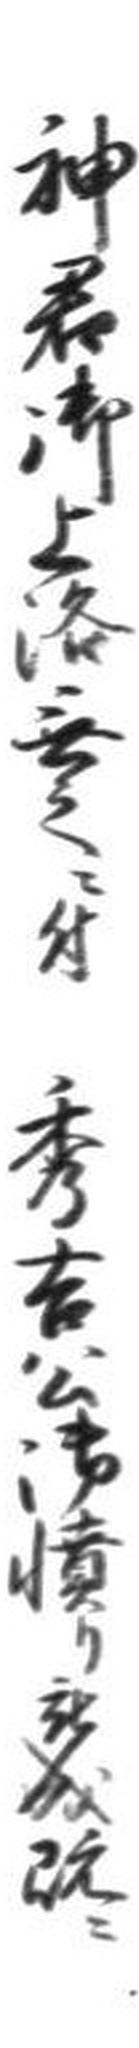神君御上洛無之ニ付秀吉公御憤り被成既ニ
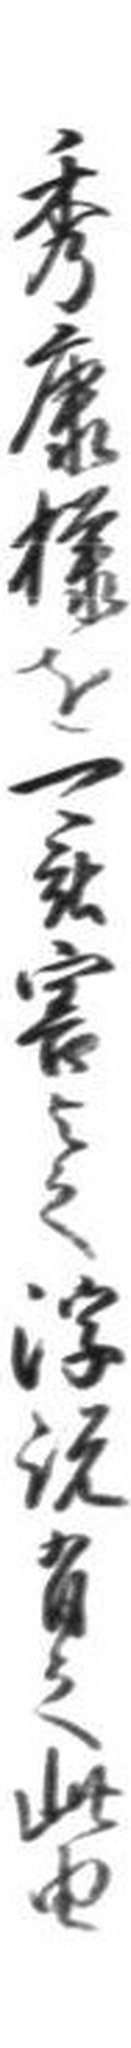秀康様を可被害与之浮説有之此由
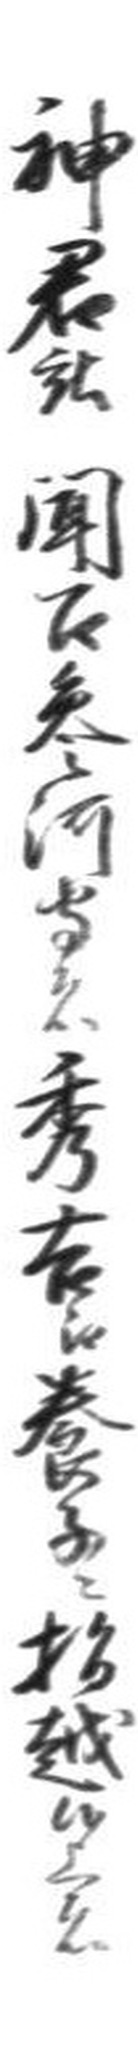神君被聞召参河守者秀吉江養子ニ指越候上者

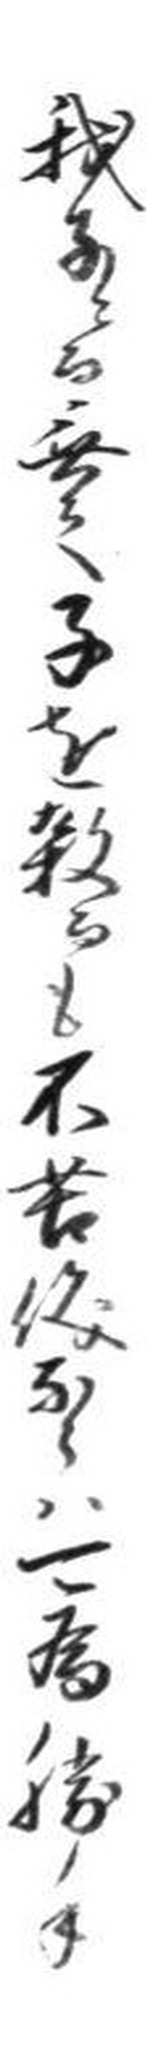我子ニ而無之子を殺而も不苦儀ならハ可為勝手
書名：家譜 一 秀康公 従天正二年到慶長十二年
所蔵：福井県文書館 Fukui Prefectural Archives
